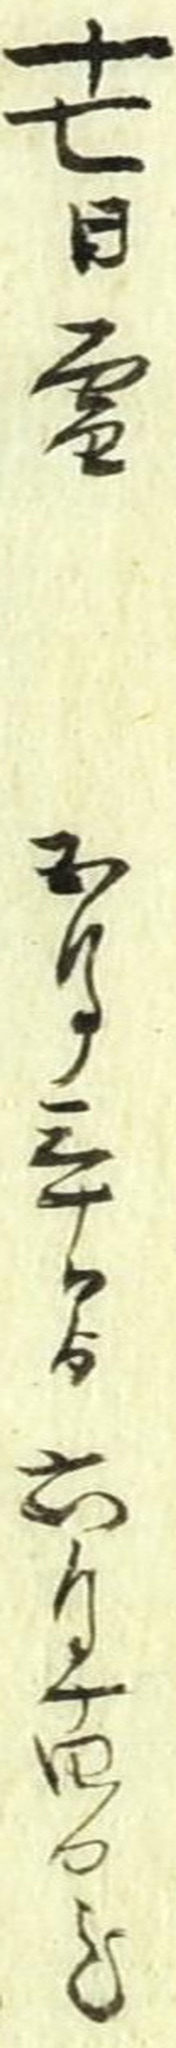十七日雪五月三十日ゟ六月十四日迄
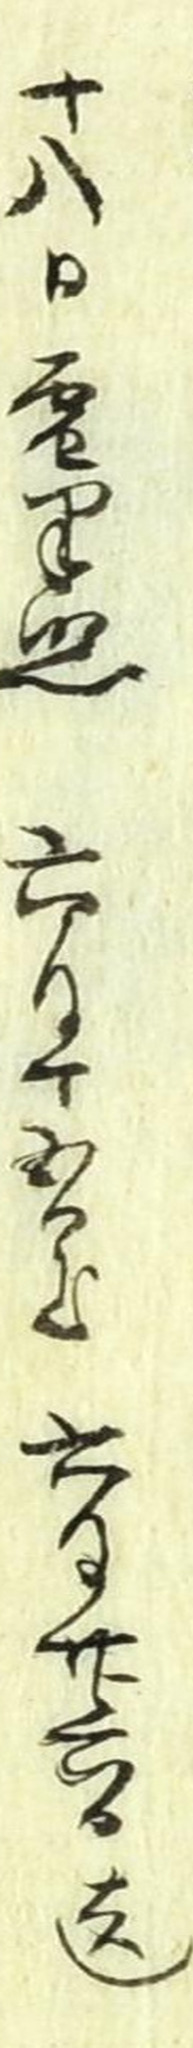十八日雪半照六月十五日ゟ六月廿六日迄
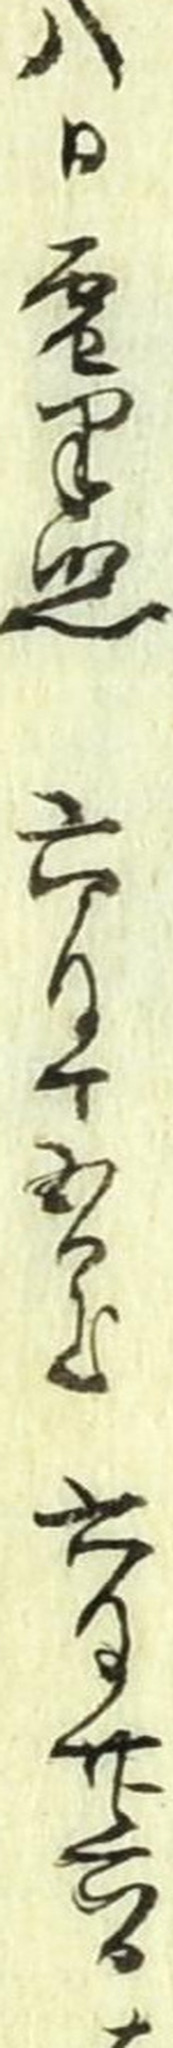十八日雪半照六月十五日ゟ六月廿六日迄
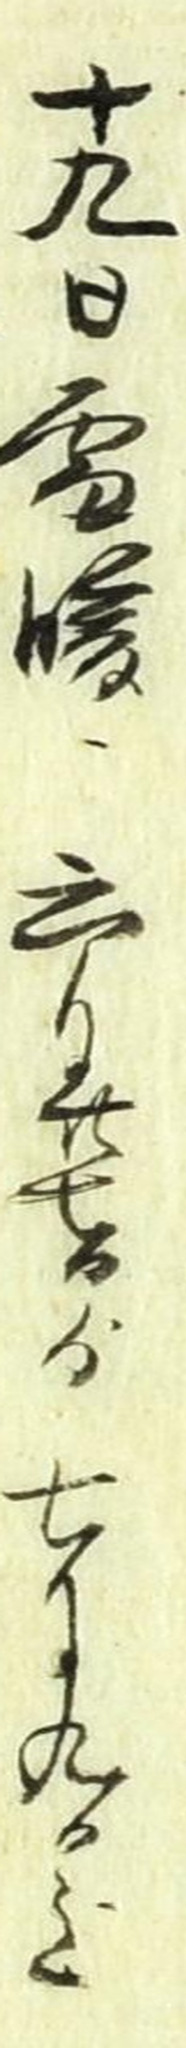十九日雪暖六月廿七日ゟ七月九日迄
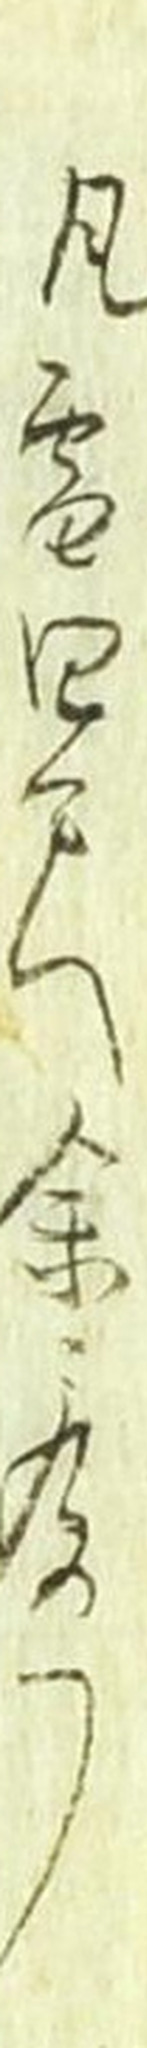風雪四尺余に及ふ
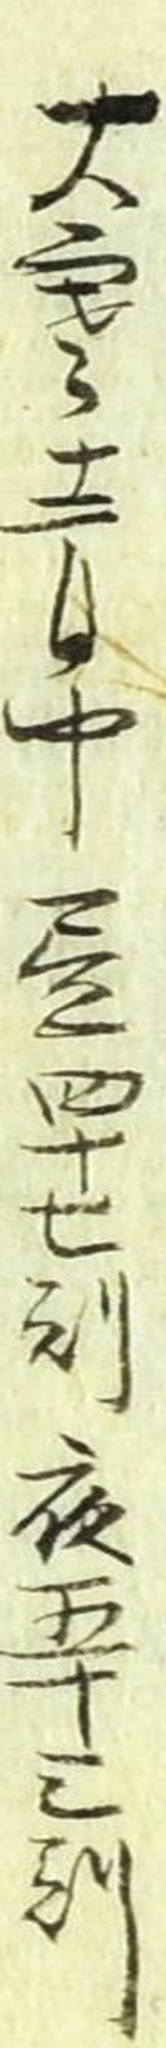大雪十二月中昼四十七刻夜五十三刻
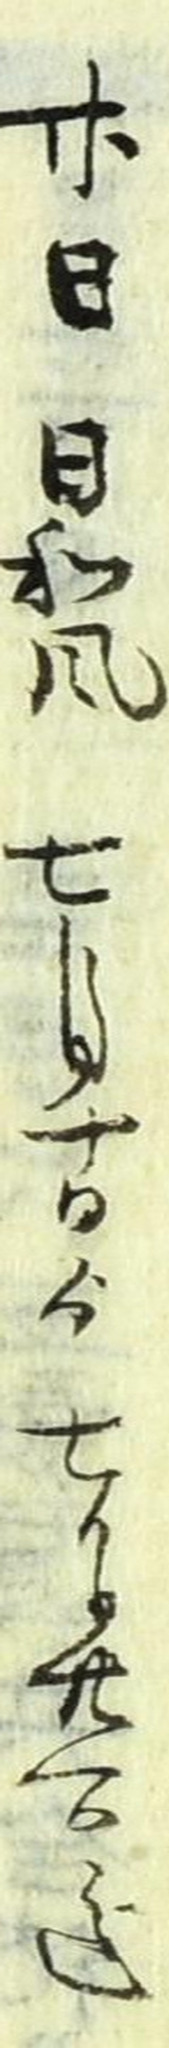廿日日和風七月十日ゟ七月廿一日迄
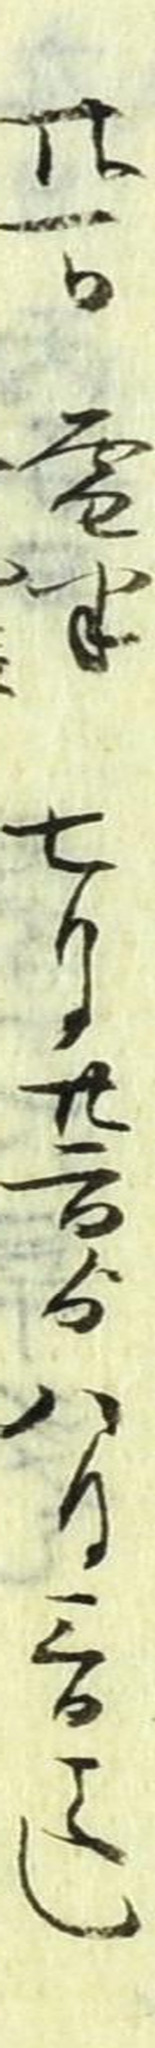廿一日雪半七月廿二日ゟ八月三日迄
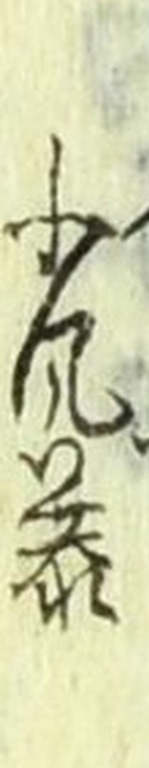北風暴
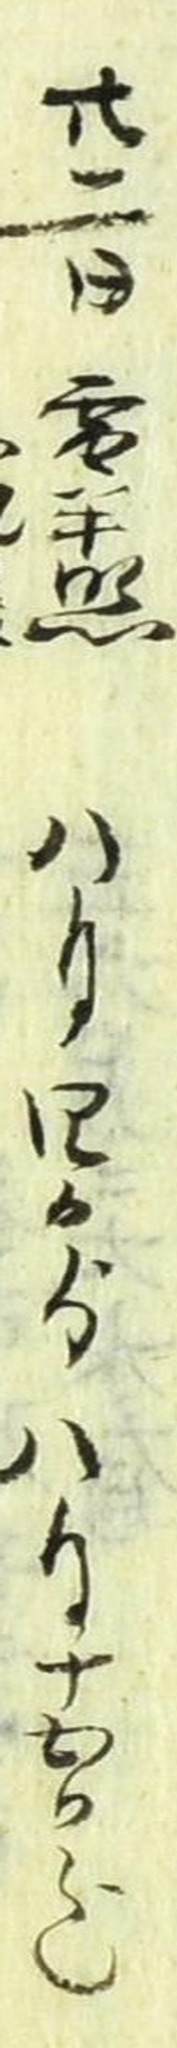廿二日雪半照八月四日ゟ八月十五日迄
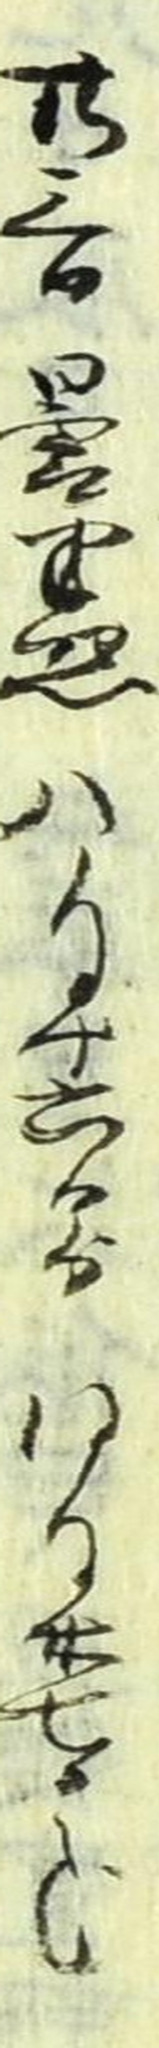廿三日曇半照八月十六日ゟ八月廿七日迄
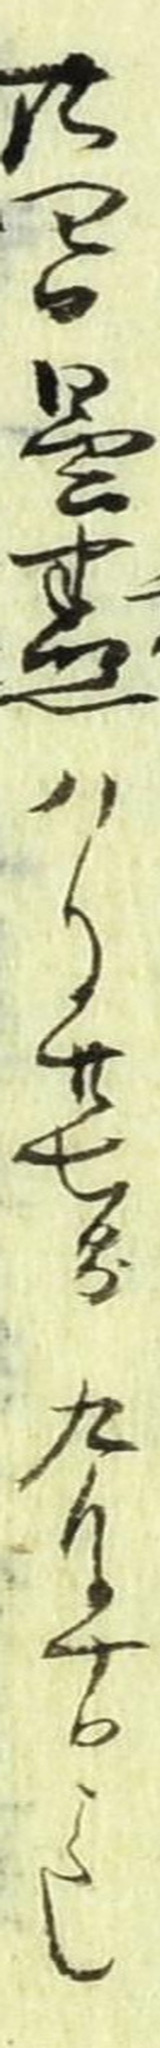廿四日曇半照八月廿七日ゟ九月十日迄
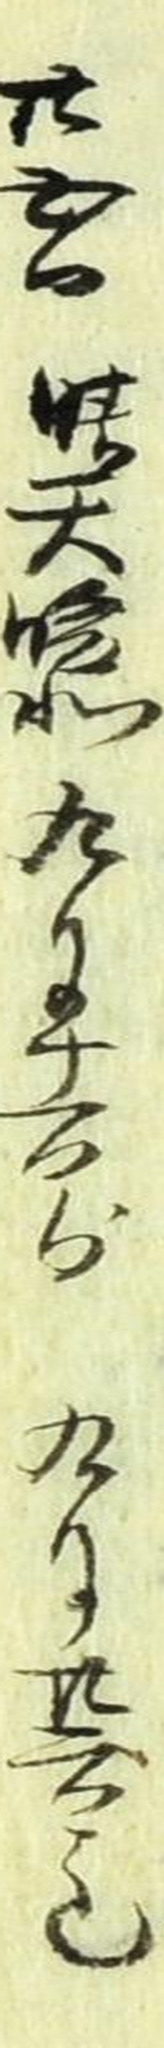廿五日晴天暖和九月十一日ゟ九月廿二日迄
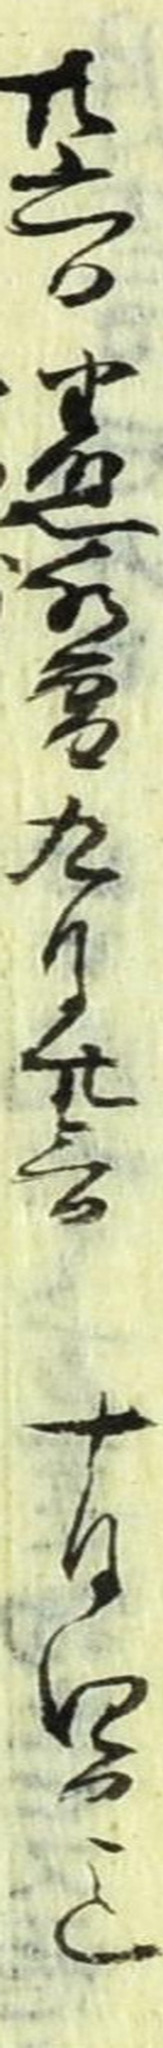廿六日半照水雪九月廿三日十月四日迄
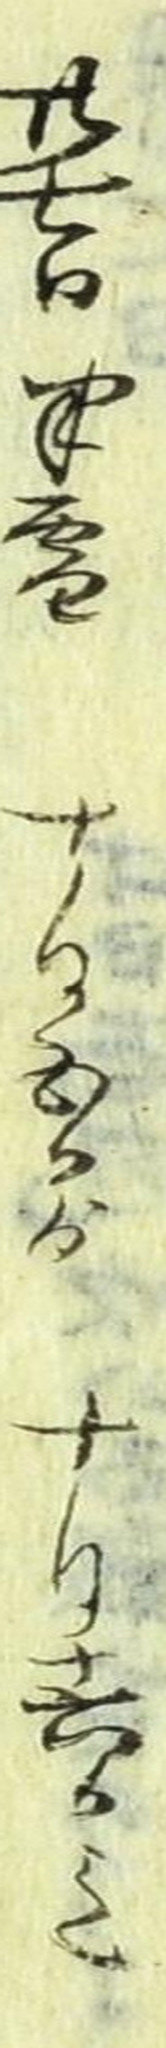廿七日半雪十月五日ゟ十月十六日迄
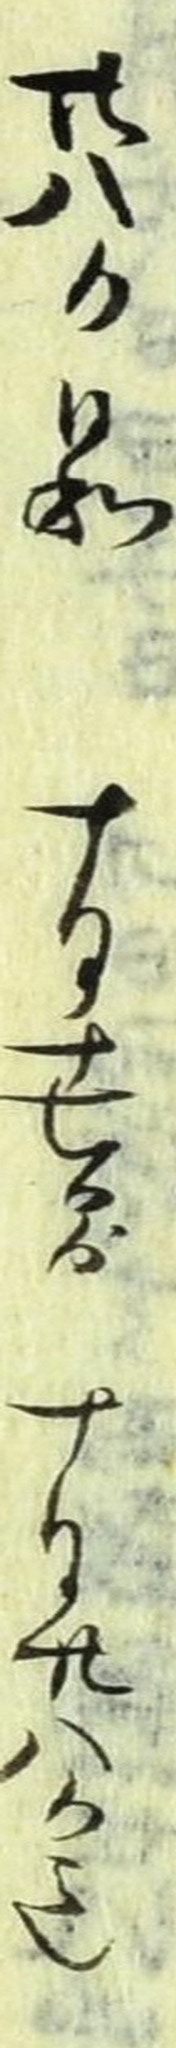廿八日日和十月十七日ゟ十月廿八日迄
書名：（日記）
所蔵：福井県文書館 Fukui Prefectural Archives
